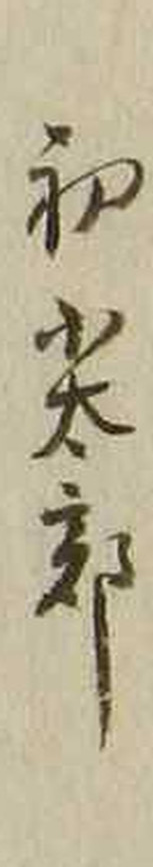初小太郎
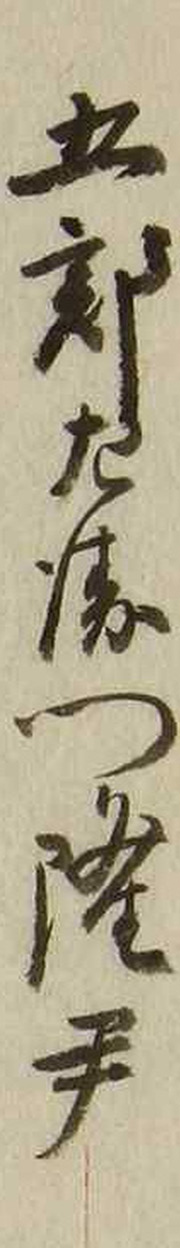五郎左衛門隆尹
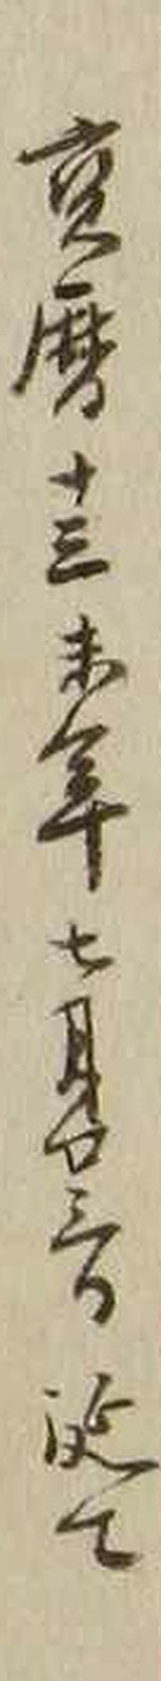宝暦十三未年七月廿三日誕生
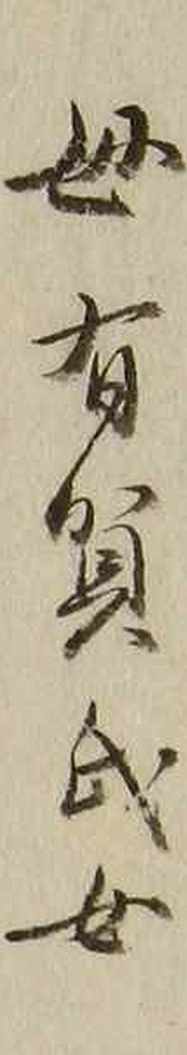母有賀氏女
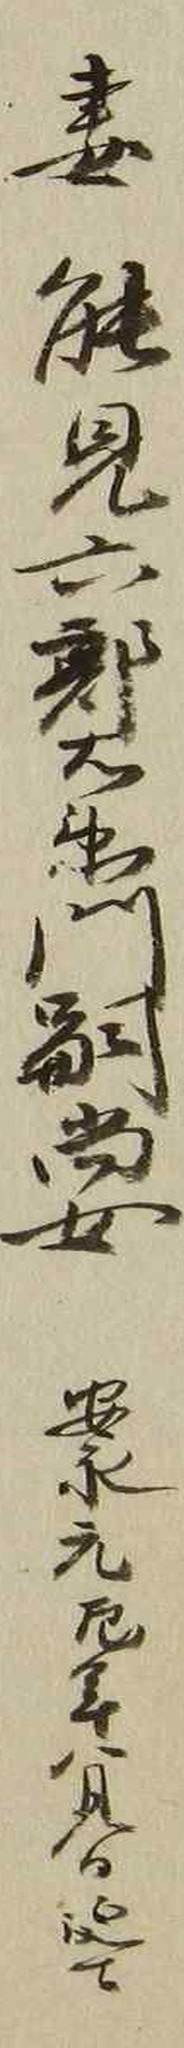妻能見六郎右衛門嗣尚女安永九辰年八月八日誕生
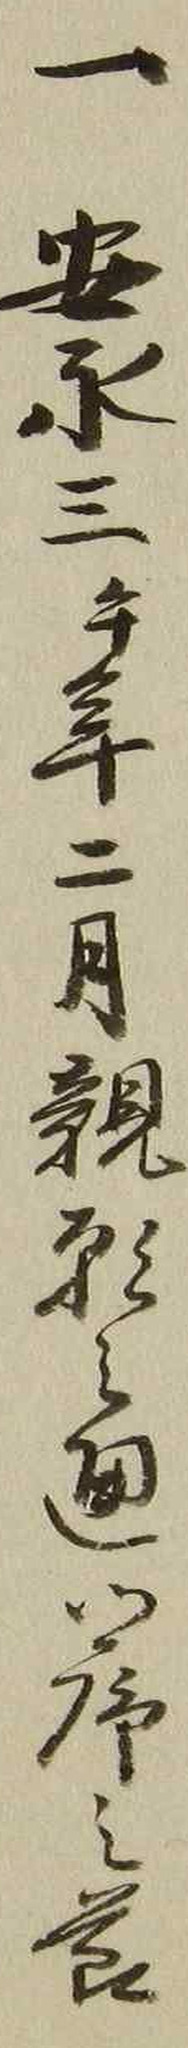一安永三午年二月親願之通御席之節
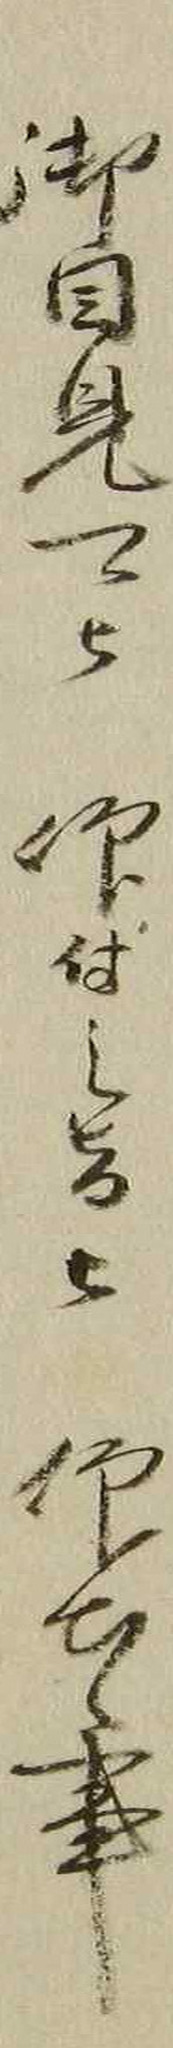御目見可被仰付之旨被仰出候事
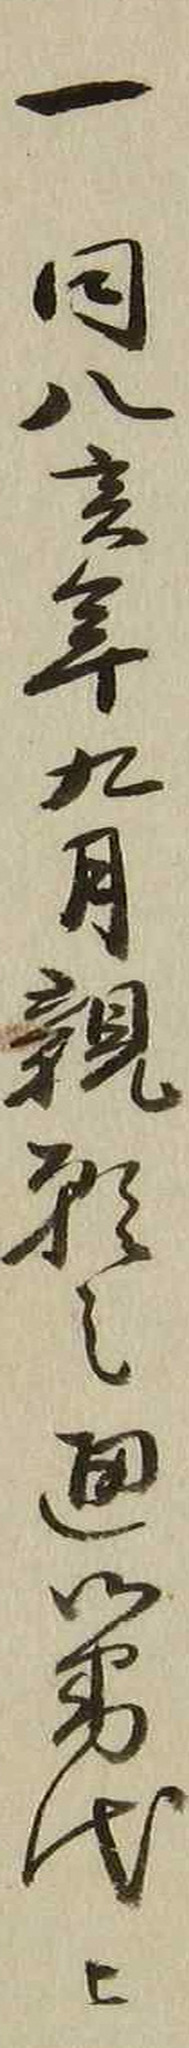一同八亥年九月親願之通御番代被
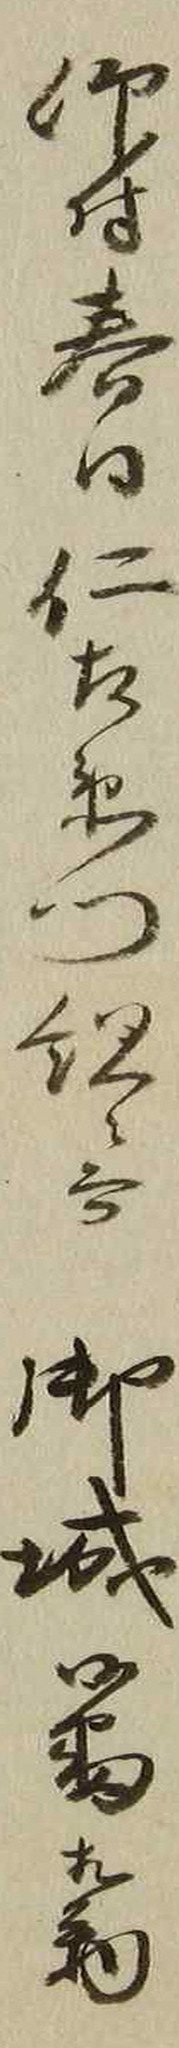仰付春日仁左衛門組ニ而御城御番相勤
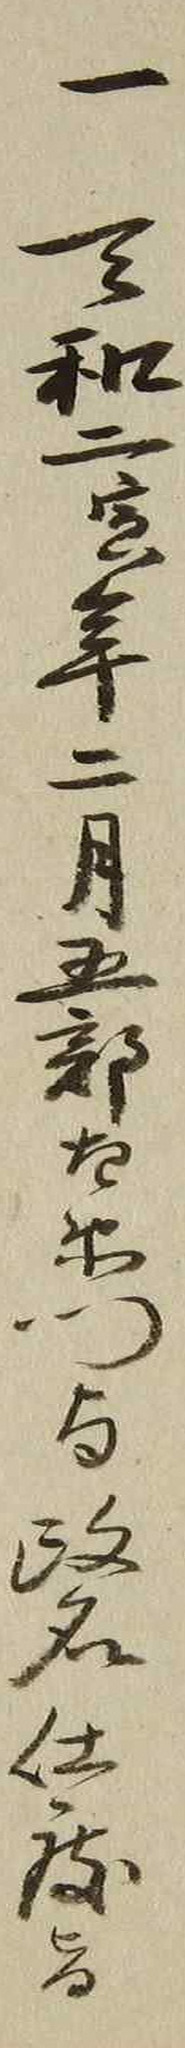一天和ニ寅年二月五郎左衛門与改名仕度旨
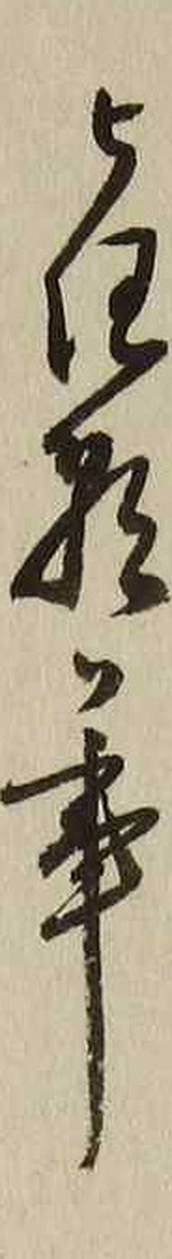被任願候事
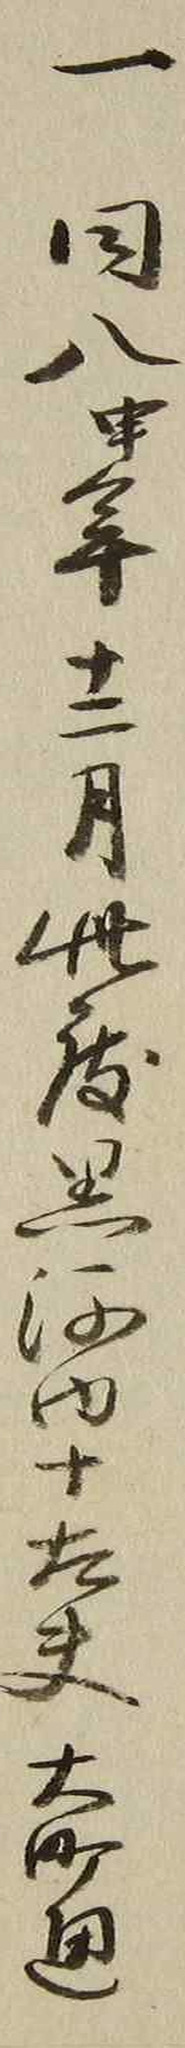一同八申年十二月此度黒河内十太夫大町通
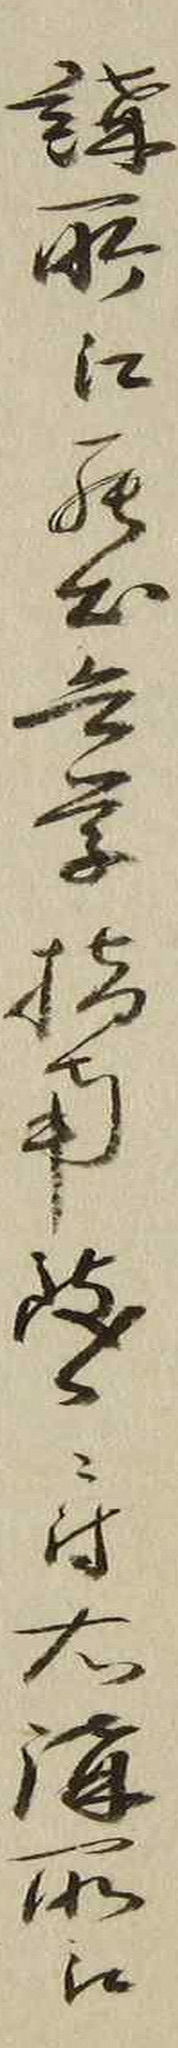講所江罷出兵学指南致候ニ付右講所江
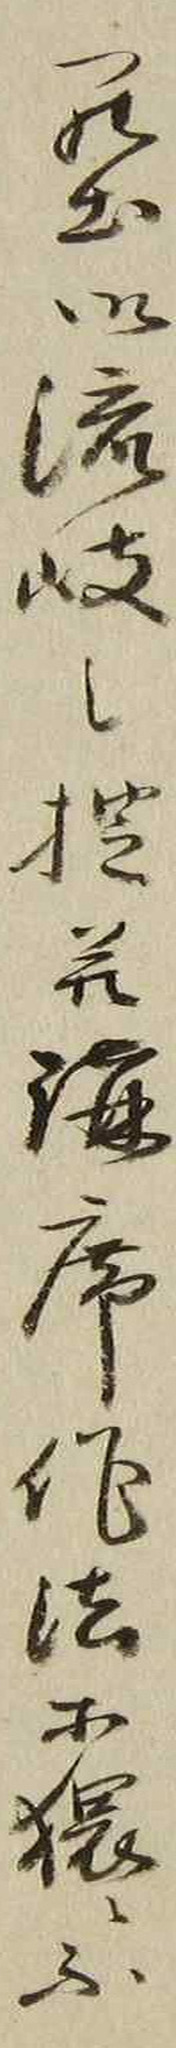罷出御流岐之掟并講席作法等猥ニ不
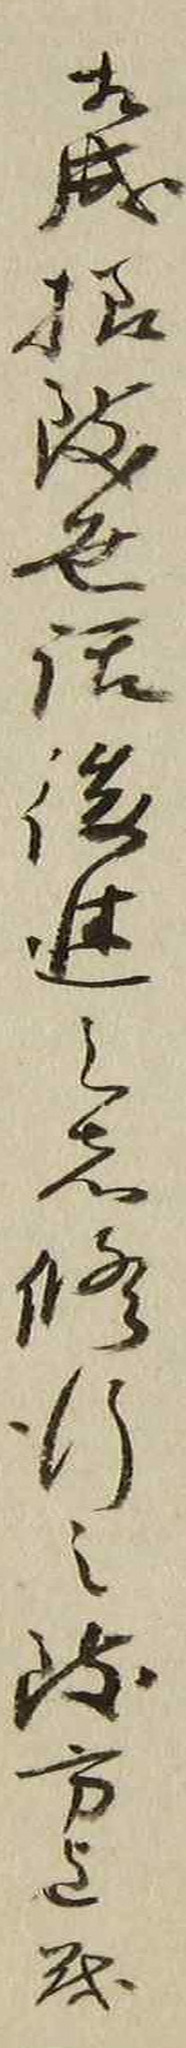相成様致世話後進之者修行之致方迄茂
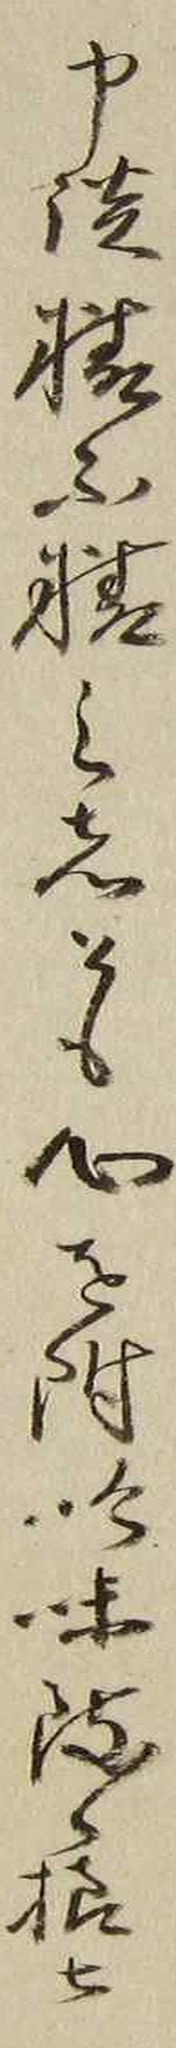申談精不精之者とも心を附吟味致候様被
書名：諸士系譜　巻之261　あ之部14
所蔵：会津若松市立会津図書館
